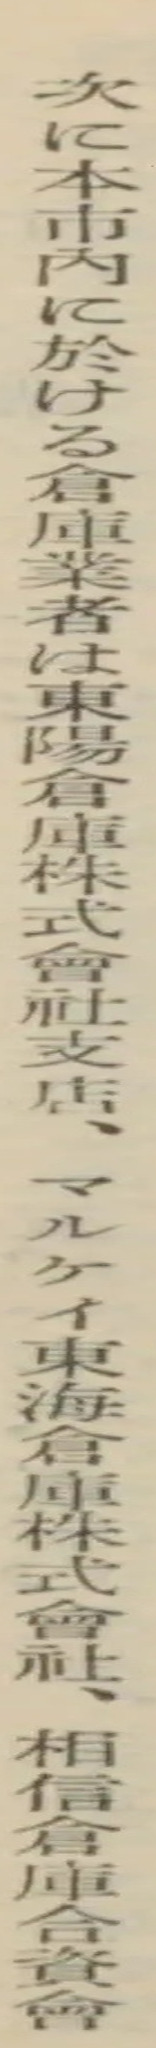次に本市内に於ける倉庫業者は東陽倉庫株式会社支店、マルケイ東海倉庫株式会社、相信倉庫合資会
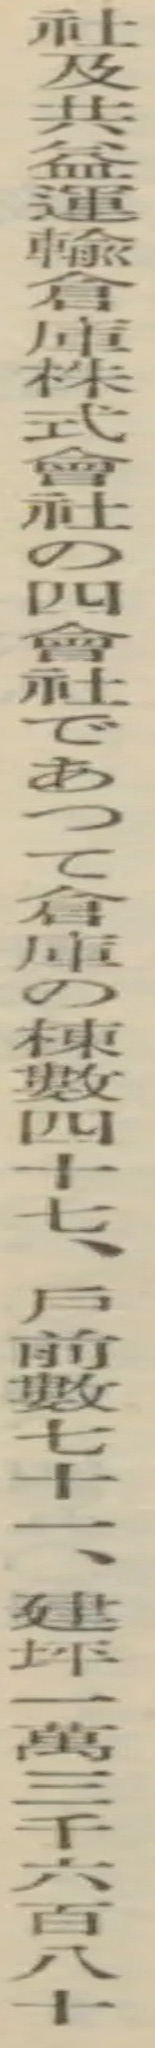社及共益運輸倉庫株式会社の四会社であつて倉庫の棟数四十七、戸前数七十一、建坪一万三千六百八十
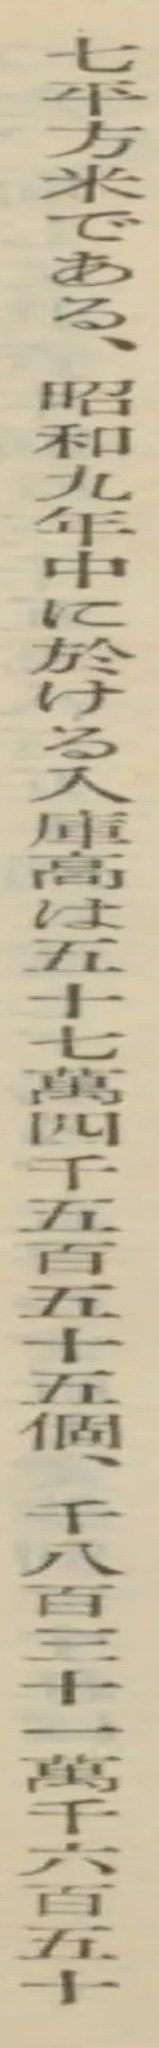七平方米である、昭和九年中に於ける入庫高は五十七万四千五百五十五個、千八百三十一万千六百五十
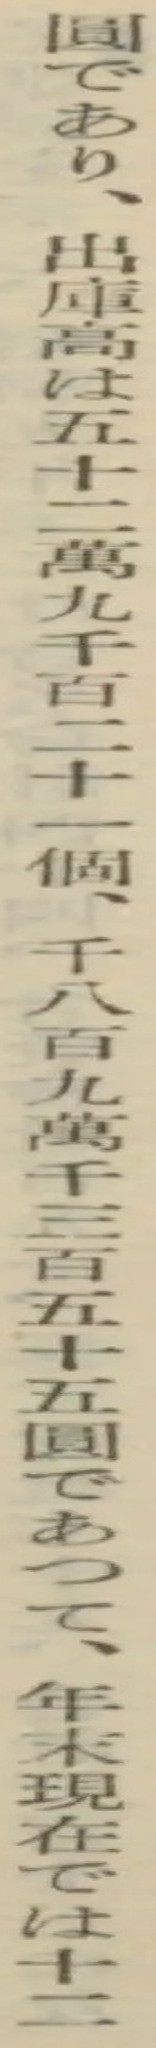円であり、出庫高は五十二万九千百二十一個、千八百九万千三百五十五円であつて、年末現在では十二
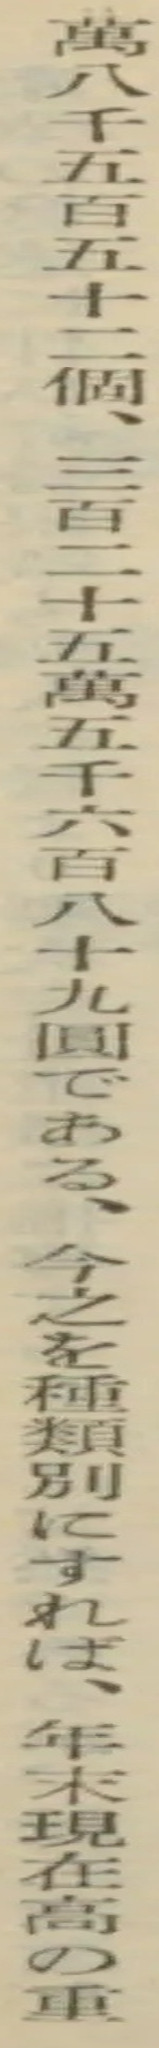万八千五百五十二個、三百二十五万五千六百八十九円である、今之を種類別にすれば、年末現在高の重
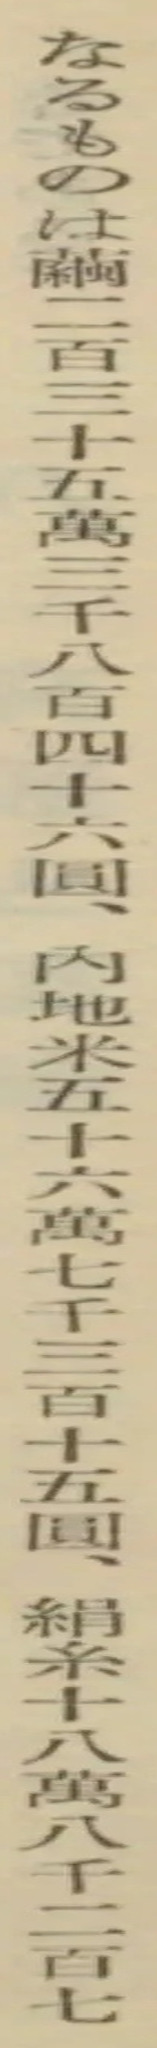なるものは繭二百三十五万三千八百四十六円、内地米五十六万七千三百十五円、絹糸十八万八千二百七
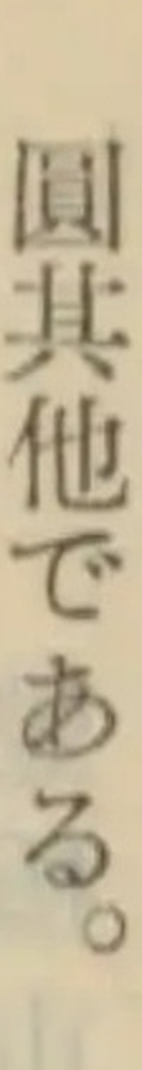円其他である。
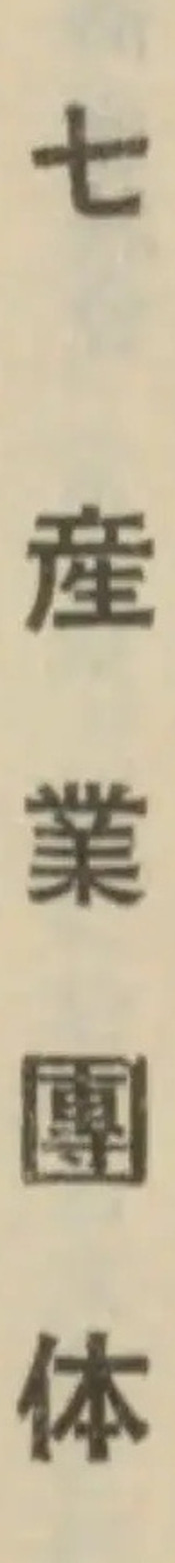七産業団体
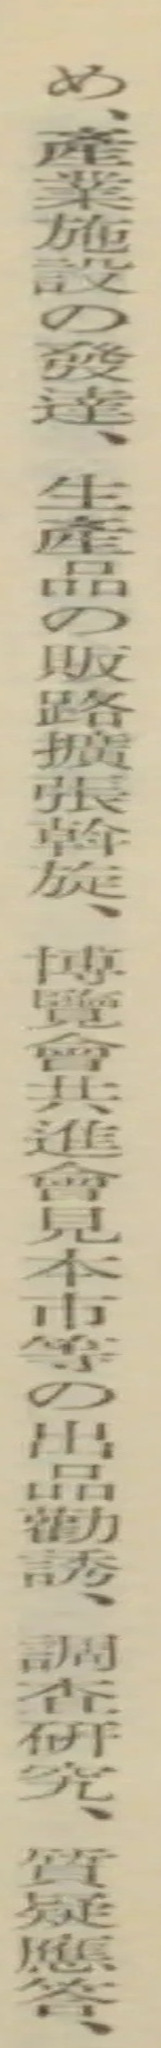め、産業施設の発達、生産品の販路拡張斡旋、博覧会共進会見本市等の出品勧誘、調査研究、質疑応答、
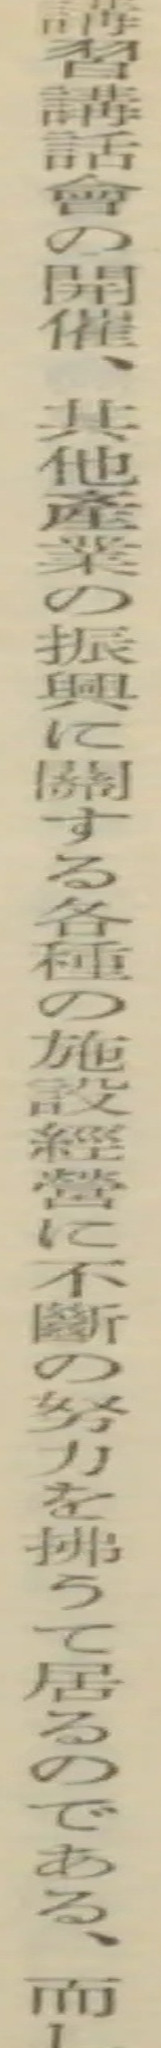講習講話会の開催、其他産業の振興に関する各種の施設経営に不断の努力を払うて居るのである、而し
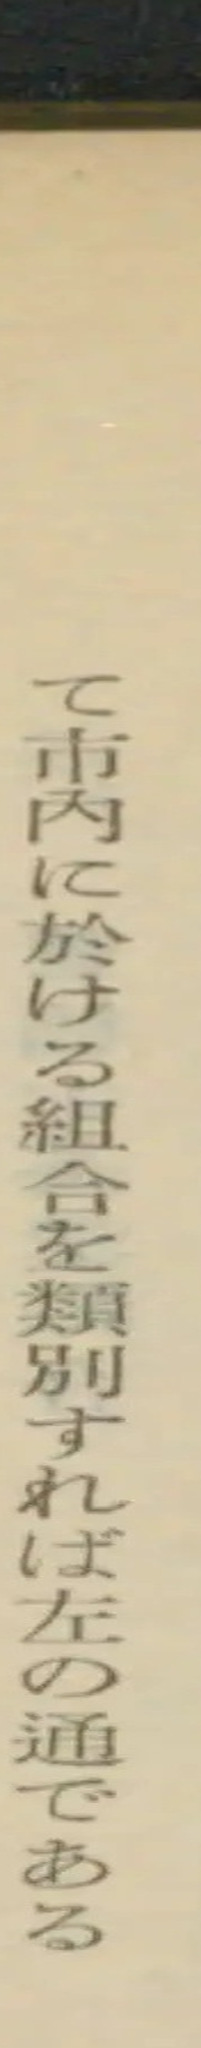て市内に於ける組合を類別すれば左の通である
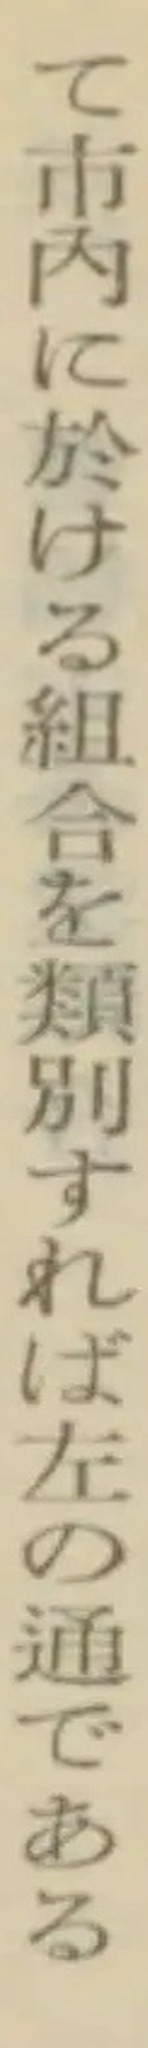て市内に於ける組合を類別すれば左の通である

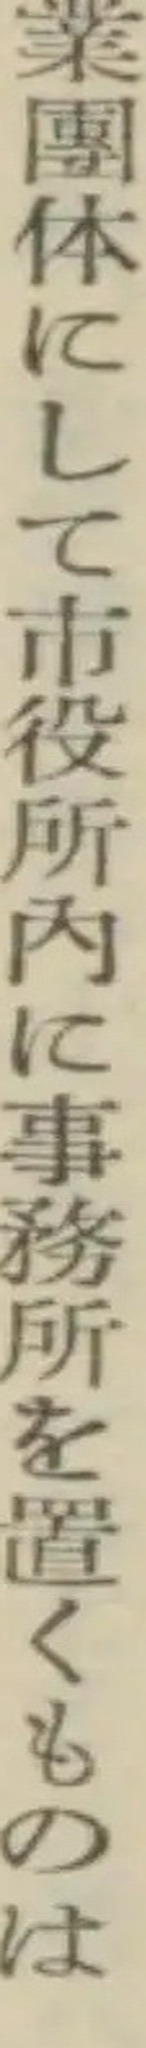産業団体にして市役所内に事務所を置くものは
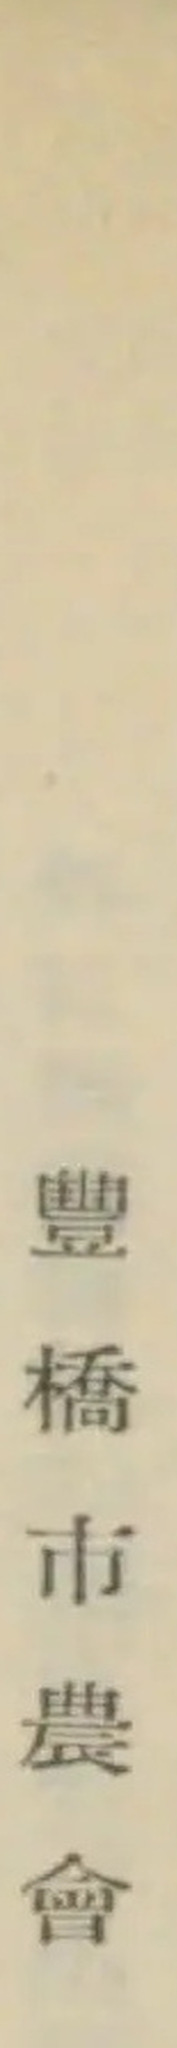豊橋市農会
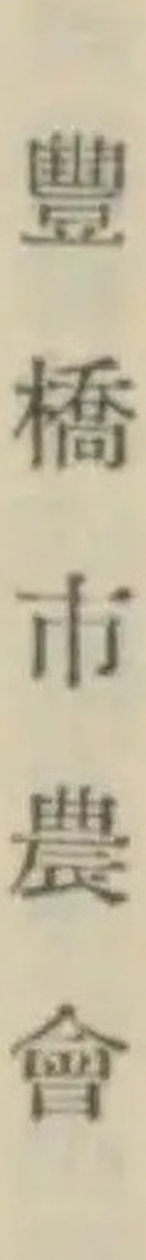豊橋市農会
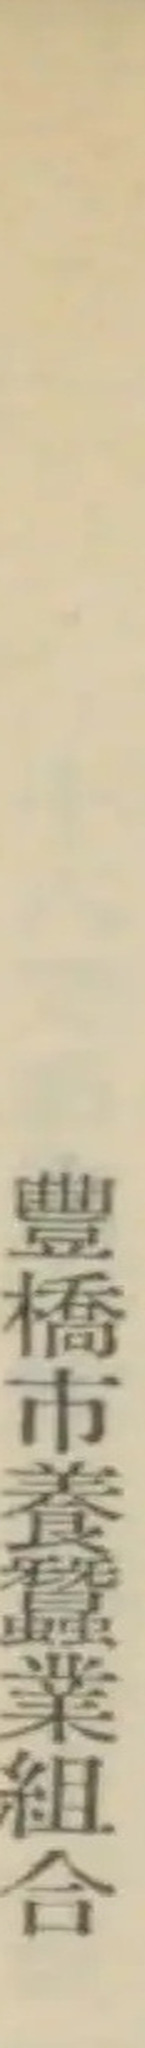豊橋市養蚕業組合
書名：産業の豊橋
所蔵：国立国会図書館 National Diet Library, JAPAN
